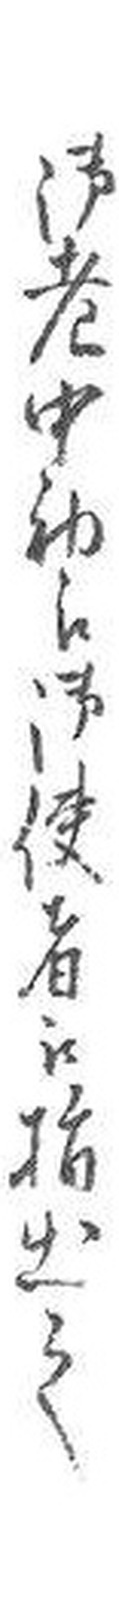御老中初江御使者被指出之
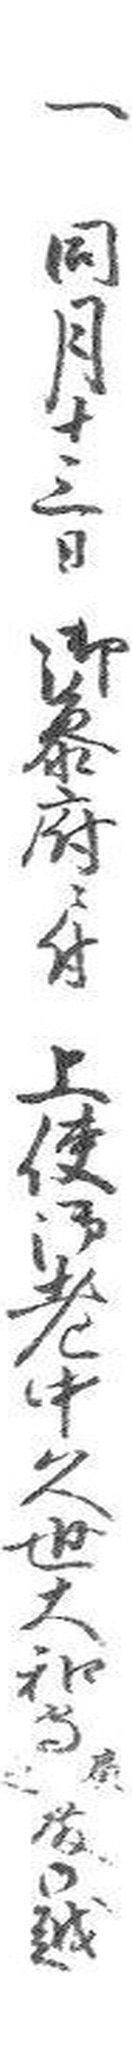一同月十三日御参府ニ付上使御老中久世大和守広之殿御越
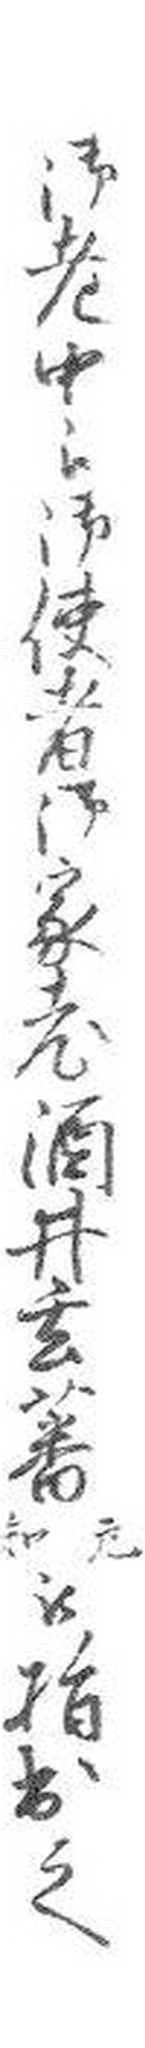御老中江御使者御家老酒井玄蕃元知被指出之
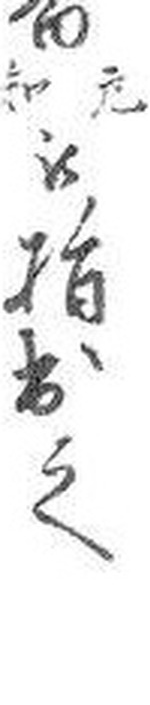被指出之
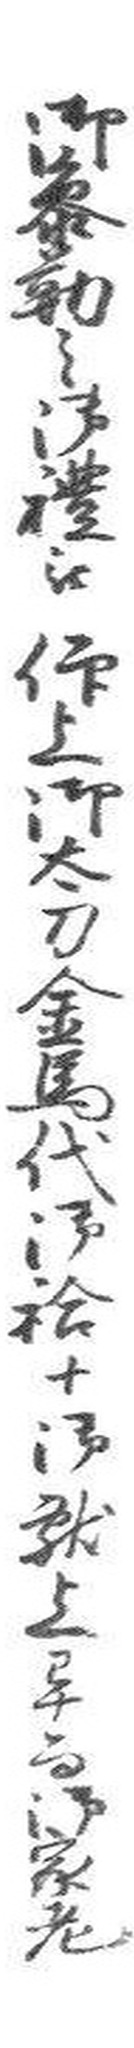御参勤之御礼被仰上御太刀金馬代御袷十御献上畢而御家老
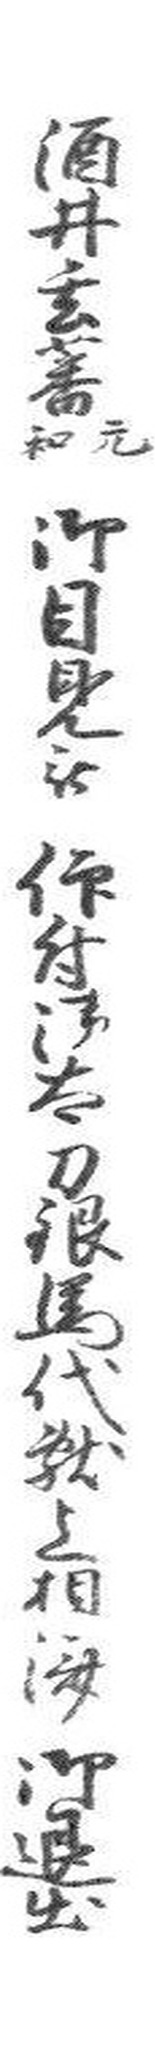酒井玄蕃元知御目見被仰付御太刀銀馬代献上相済御退出
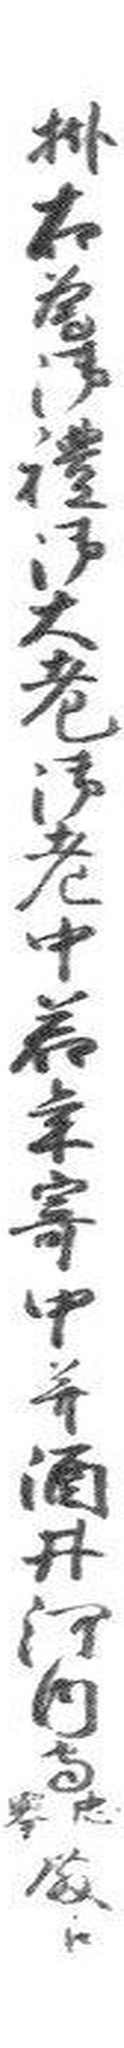掛右為御礼御大老御老中若年寄中并酒井河内守忠挙殿江
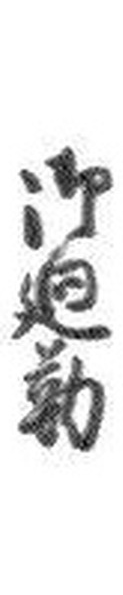御廻勤
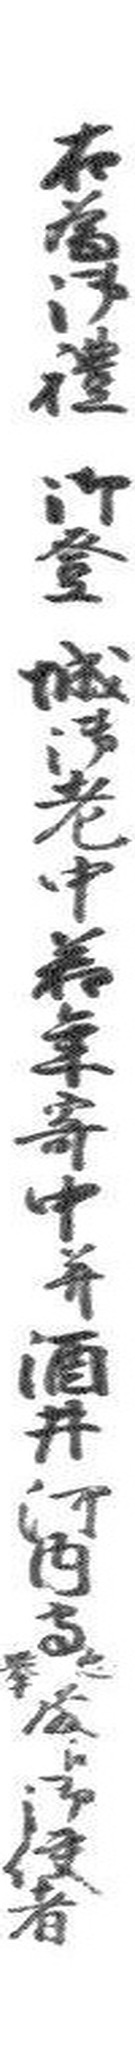右為御礼御登城御老中若年寄中并酒井河内守忠挙殿江御使者
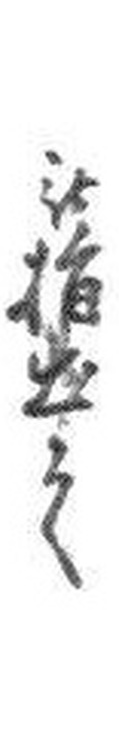被指出之
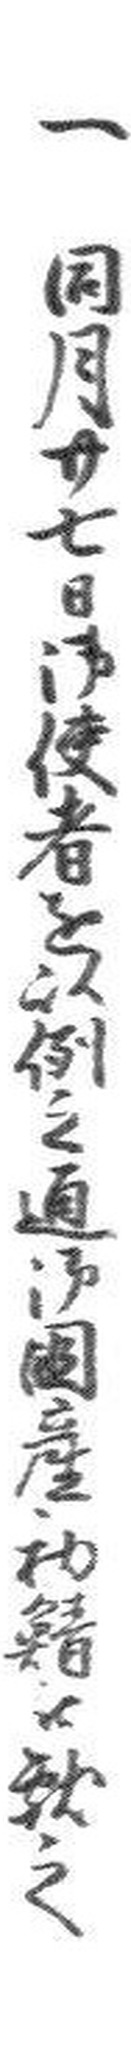一同月廿七日御使者を以例之通御国産初鯖被献之
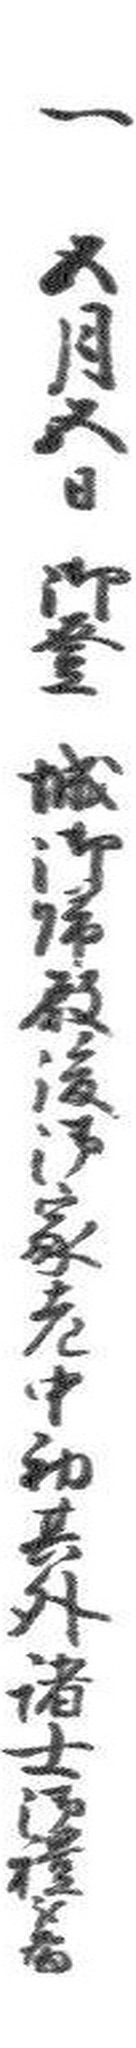一五月五日御登城御帰殿後御家老中初其外諸士御礼被為

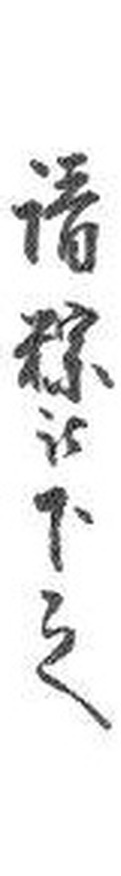請粽被下之
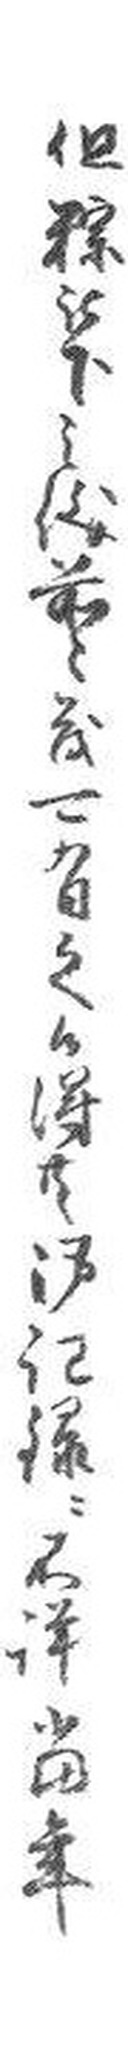但粽被下之儀前々も可有之候得共御記録ニ不詳当年
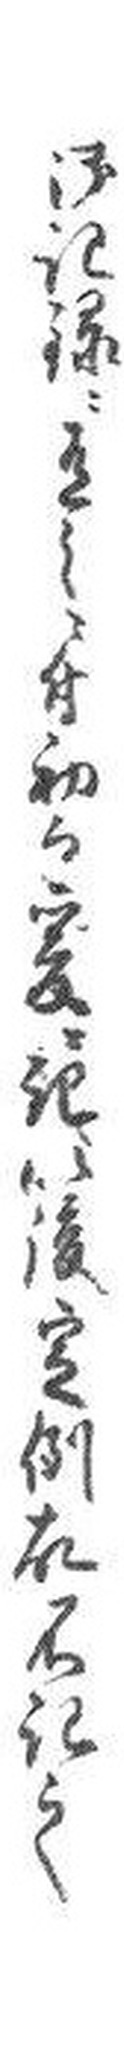御記録ニ有之ニ付初而爰ニ記以後定例故不記之
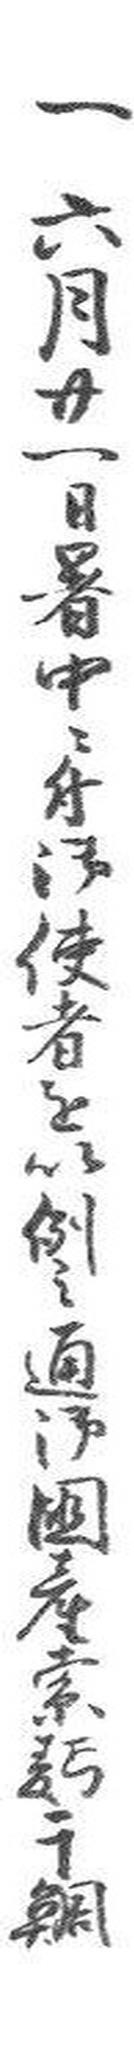一六月廿一日暑中ニ付御使者を以例之通御国産索麪干鯛
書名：家譜 七 光通公 従寛文四年到同九年
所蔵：福井県文書館 Fukui Prefectural Archives
